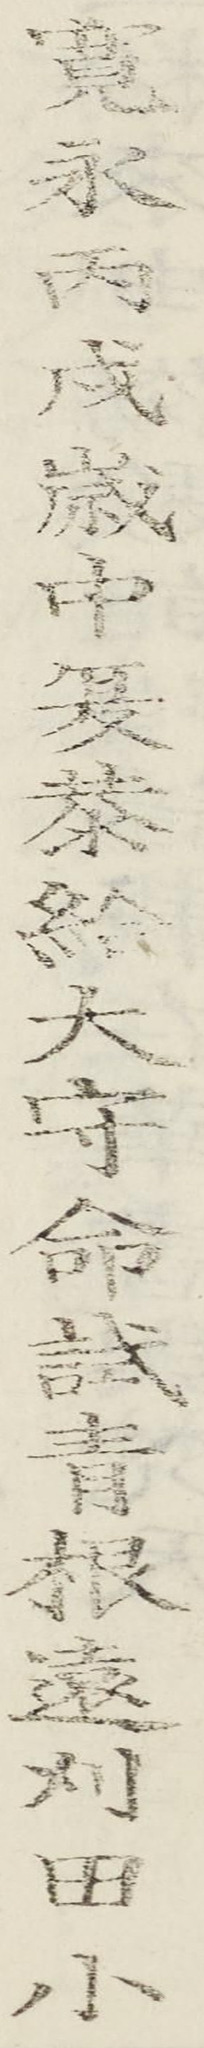寛永丙戍歳中夏恭給大守命試青根遠刈田小
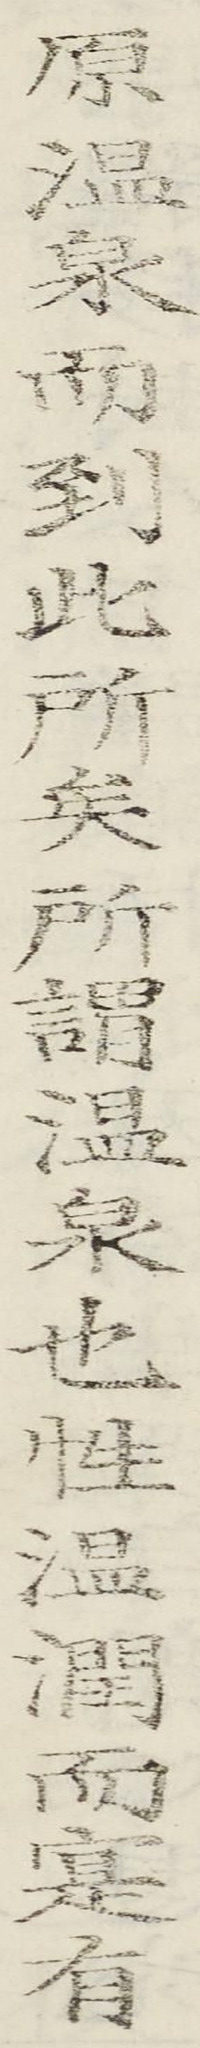原温泉而到此所矣所謂温泉也性温潤而寔有
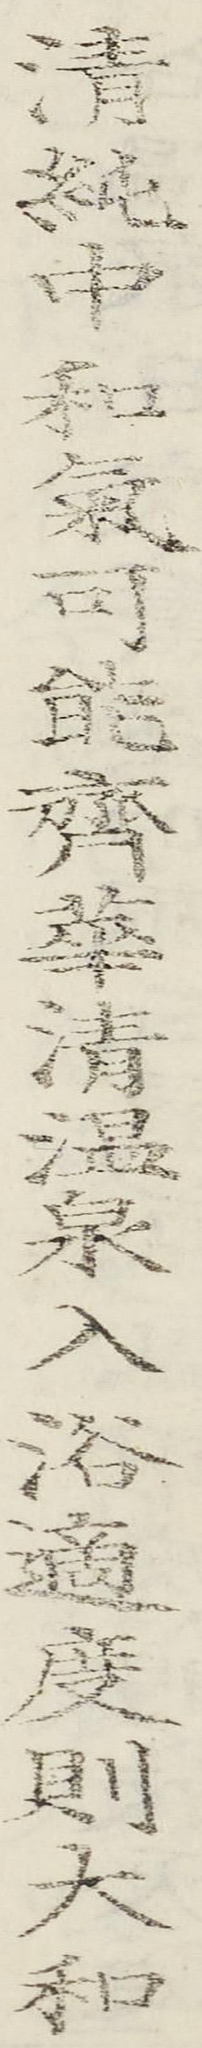清純中和気可能斉華清温泉入浴適度則大和
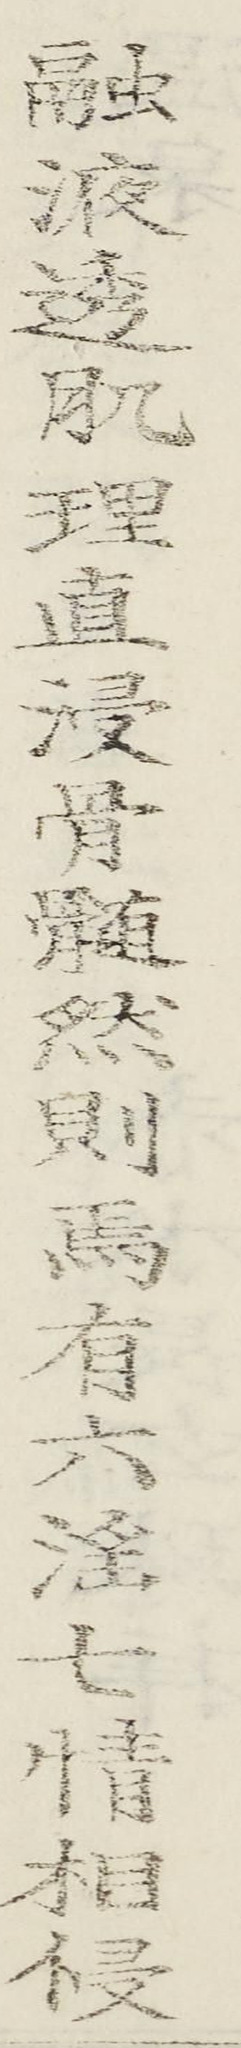融液透肌理直浸骨髄然則焉有六淫七情相侵
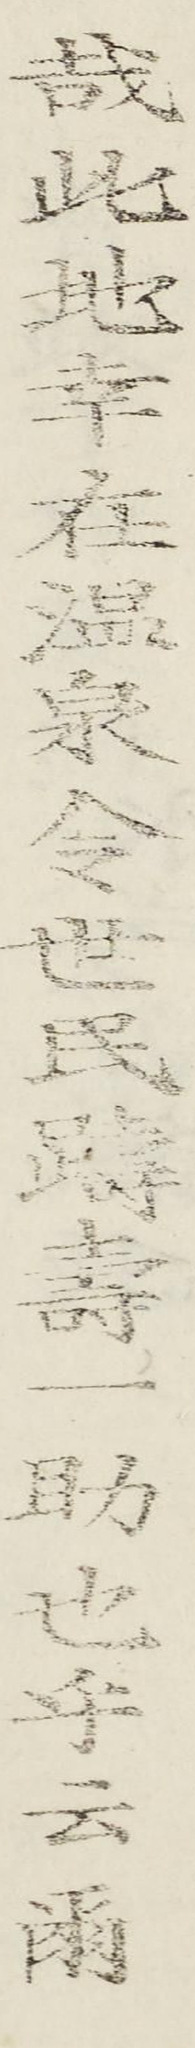哉此地幸在温泉令世民躊寿一助也乎云爾
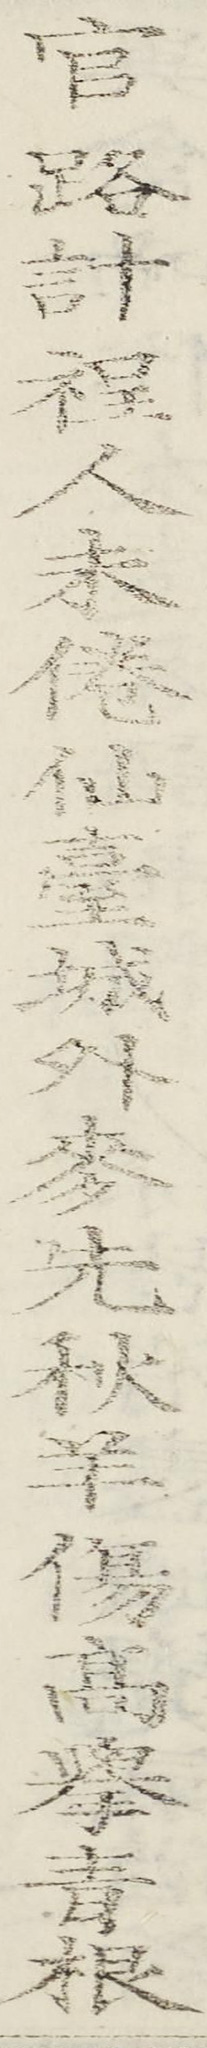官路計程人未倦仙台城外麦先秋羊傷高挙青根
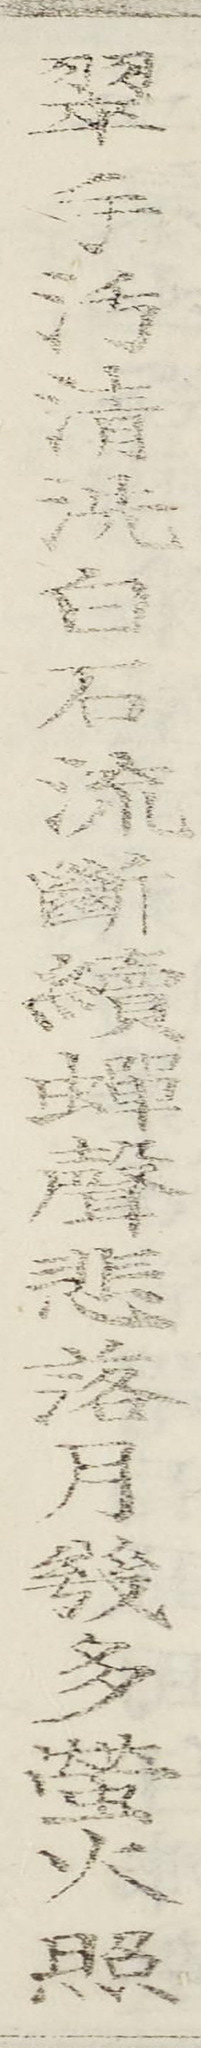翠乎汚清洗白石流断続蟬声悲落月幾多蛍火照
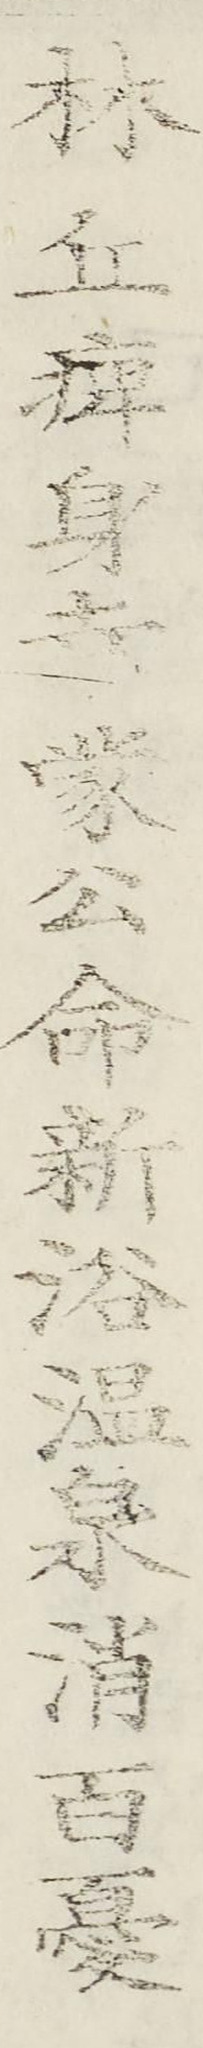林丘痺身幸蒙公命新浴温泉消百憂
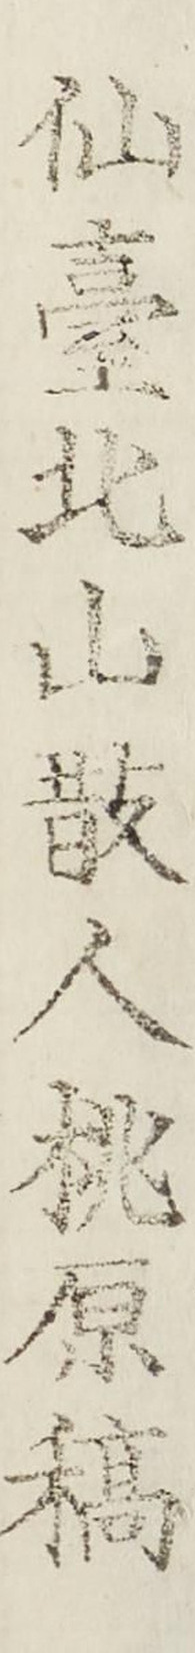仙台北山散人桃原稿
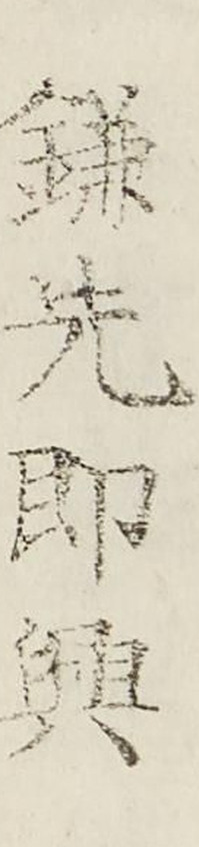鎌先即興

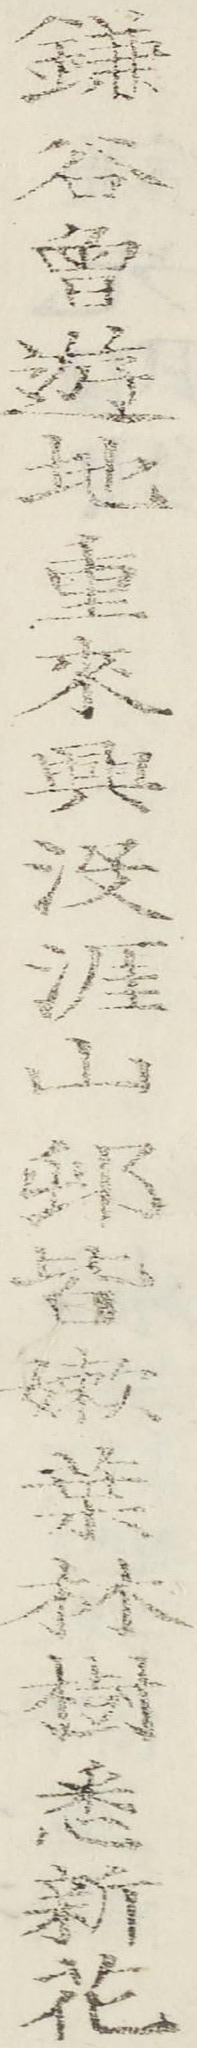鎌谷曽遊地重来興没涯山邨皆嫰葉林樹悉新花
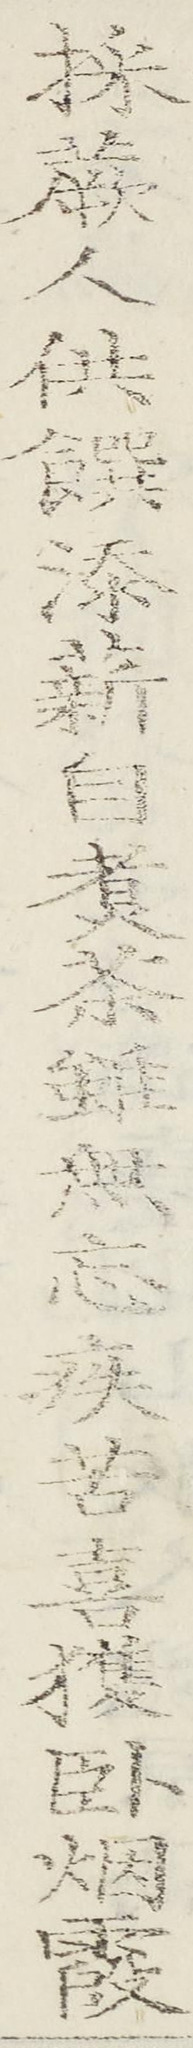採蕨人供饌添薪自煮茶雖無忘疾苦喜獲卧煙霞
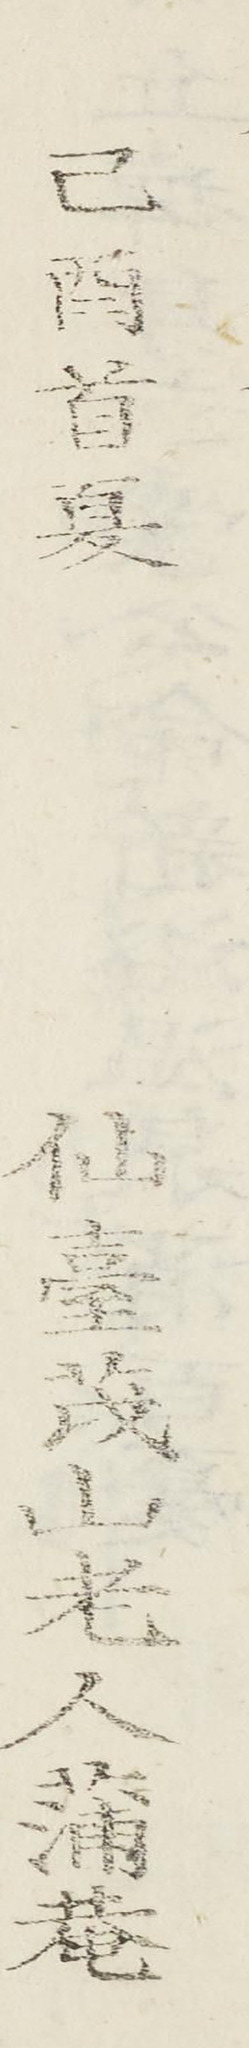己酉首夏仙台茂山老人蒲庵
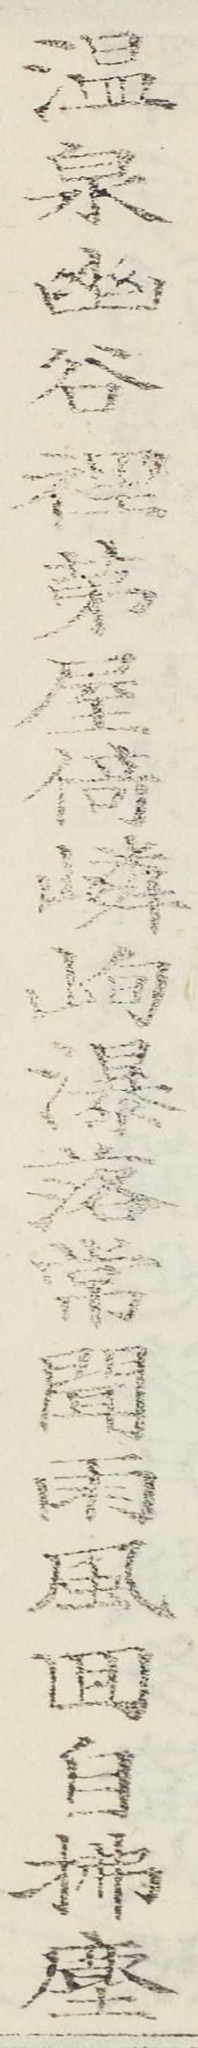温泉幽谷裡茅屋倚嶙峋瀑落常聞雨風回自払塵
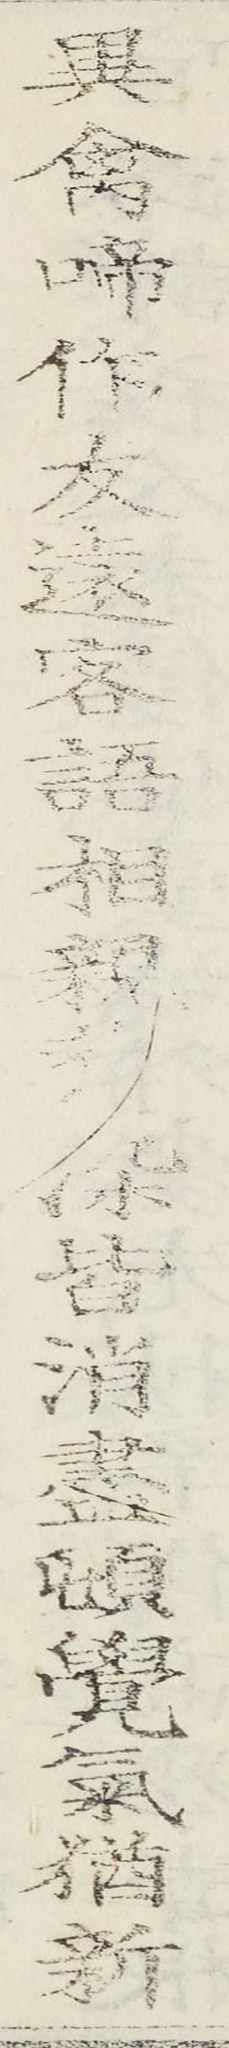異禽啼作友遠客語相親旧染皆消尽頓覚気猶新
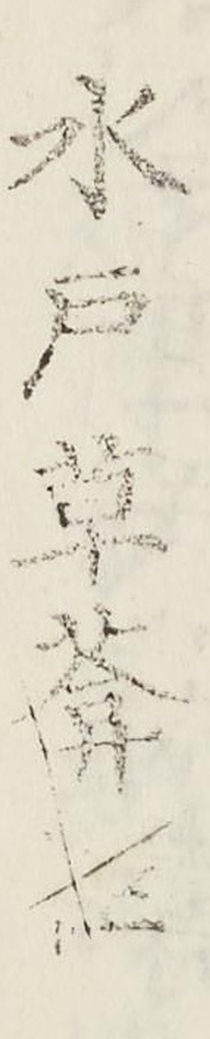水戸草莽臣
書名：鎌先温泉由來記
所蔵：東京大学地震研究所図書室 Earthquake Research Institute Library, The University of Tokyo, JAPAN
